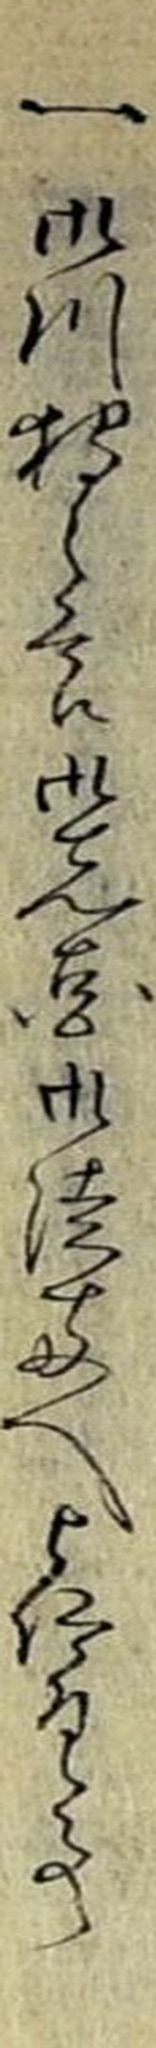一御川狩之節御先固御徒両人被仰付候事
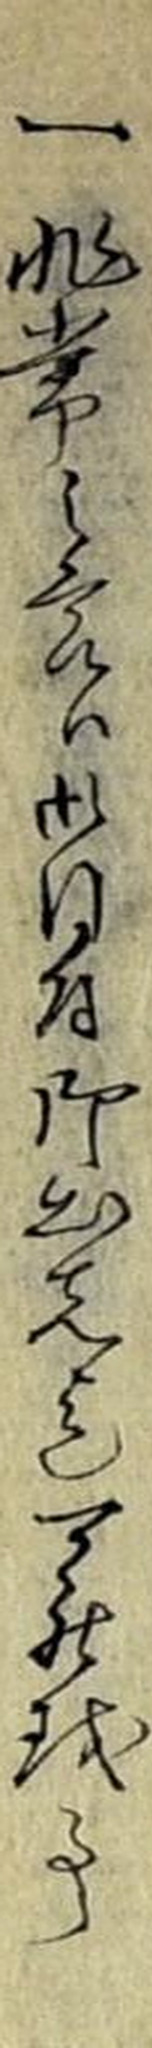一非常之節は御目付御出先迄可罷越事
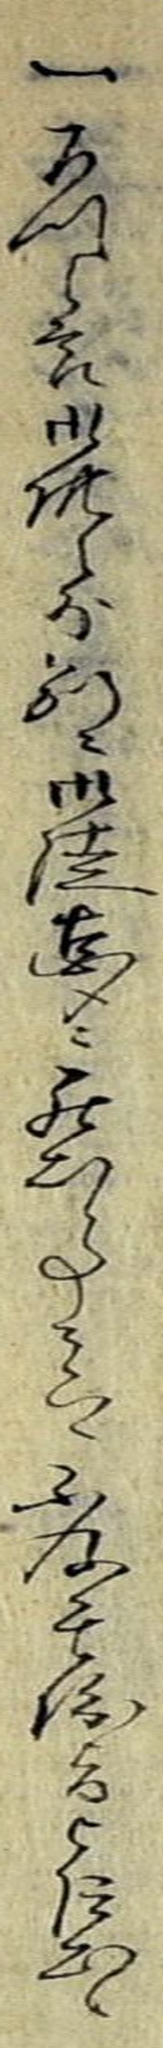一下川之節御供之外別に御徒固メに罷出候事に候はヽ不及其儀旨被仰出候
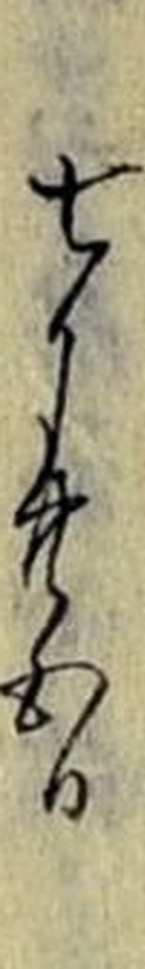七月廿五日
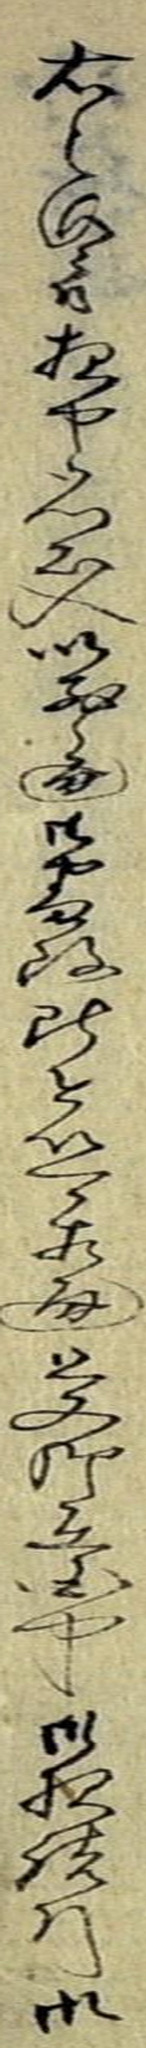右之趣に付夜中御門出入以前之通御番改断を以可相通且又御在国中御夜詰引御
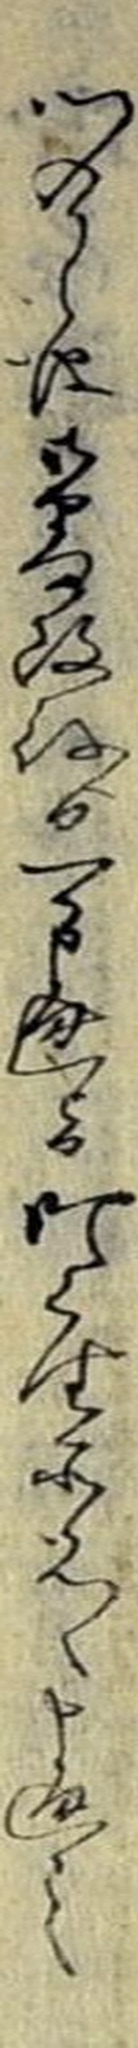門〆り候儀御番改役ゟ可申通旨御座所御門へ申通之
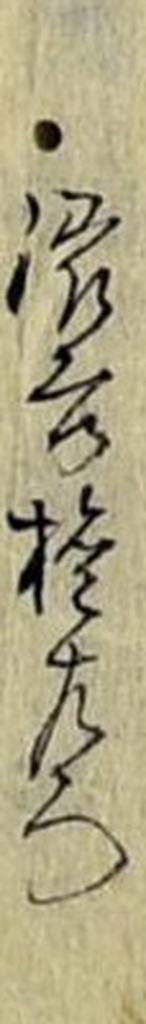江戸に而渋谷権左衛門
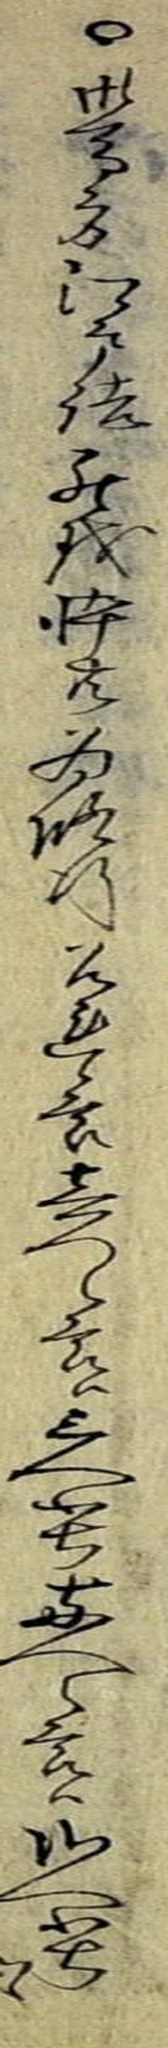○御馬方江戸詰罷越忰共為修行召連候節壱人之節は三人ふち両人之節は弐人ふちつヽ
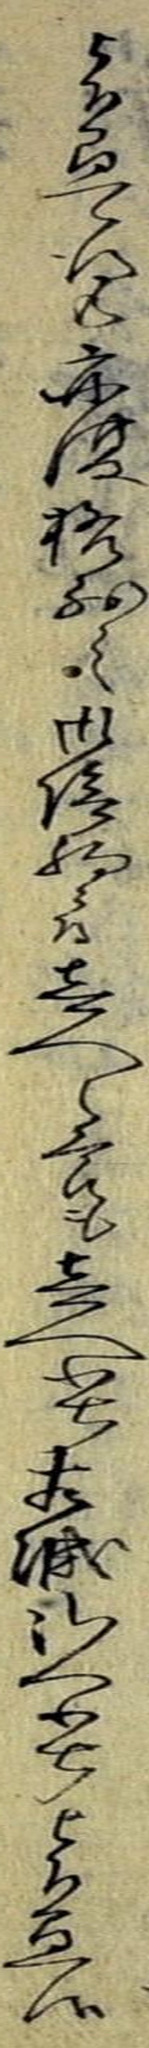被下置候得共亦復格別之御倹約に付壱人之節も壱人ふち相減弐人ふち被下置候
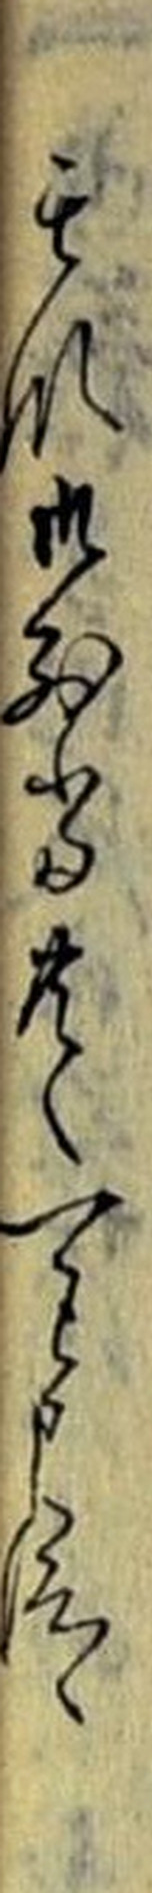其段御別当共へ可申渡候
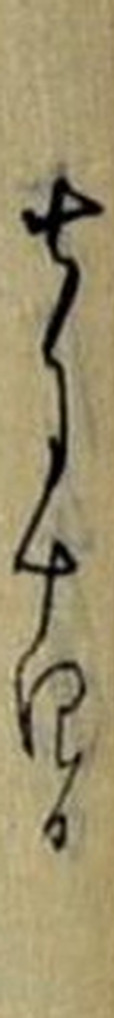七月十四日
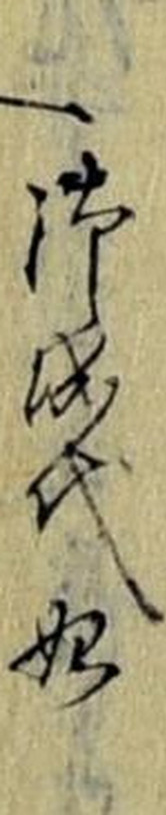御城代始
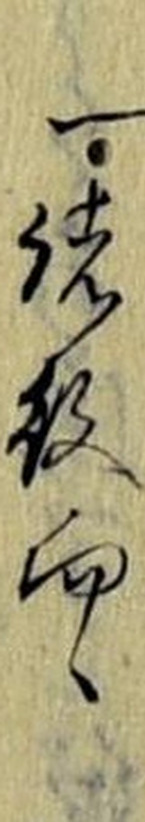諸役向へ
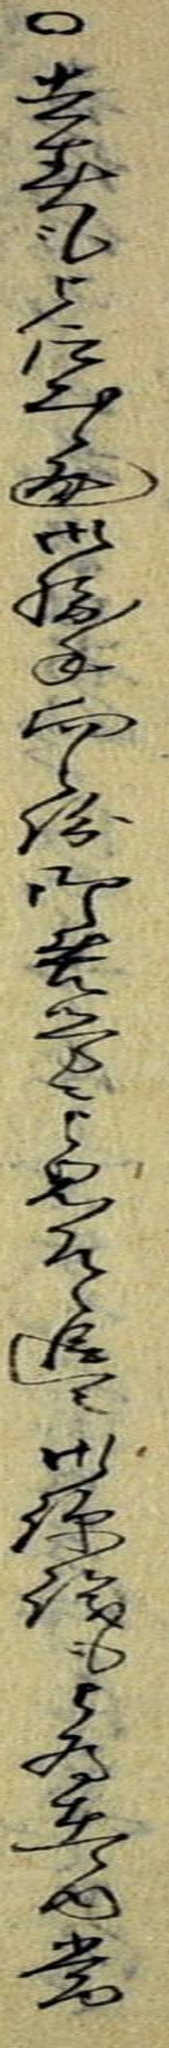○去春も被仰出候通御勝手向之儀御苦労に被思召候追々御評議も被為在候内当
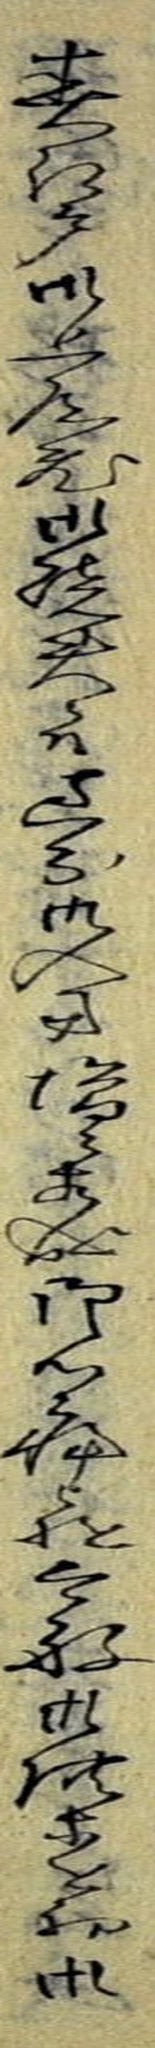春江戸御上屋敷御焼失に付過分御入用増に相成御心痛被遊今般御供等を初御
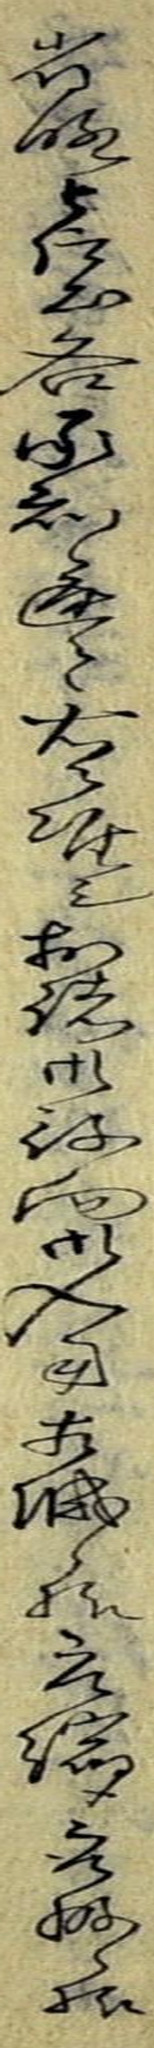省略被仰出各承知候通に候右に准し於諸御役向御入用相減候様取縮メ取扱候様
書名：命令之部 四
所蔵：福井県文書館 Fukui Prefectural Archives
